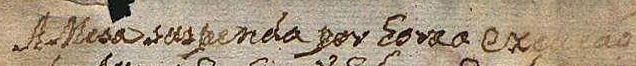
A Mesa suspenda por hora a ex_aõ
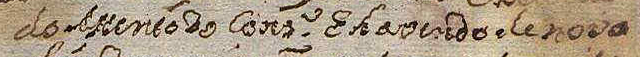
do Assento do Cons.o E havendo de novo
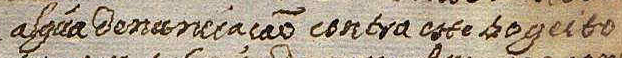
algūa denunciaçaõ contra este sogeito
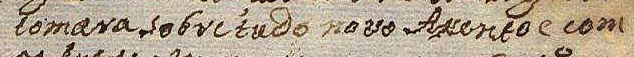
tomara sobre tudo novo Assento e com
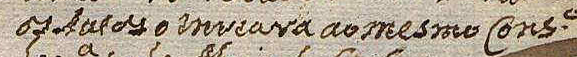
os Autos o inviara ao mesmo Cons.o
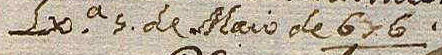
Lx.a 5. de Maio de 676.
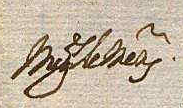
Mages de Men̄s.
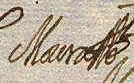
Moura
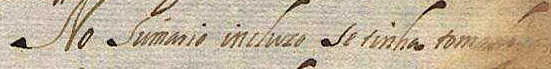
No Sumario incluzo se tinha tomado
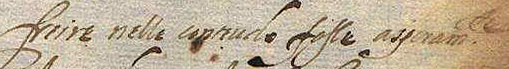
freire nelle conteudo fosse asperam.te
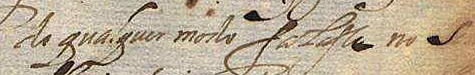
de quaquer modo falasse no S
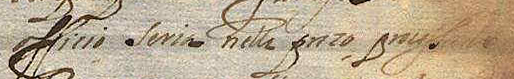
officio seria nelle prezo, processado
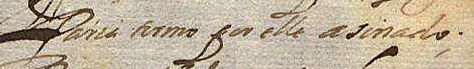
faria termo por elle asinado;
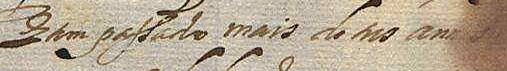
E tem passado mais de tres annos
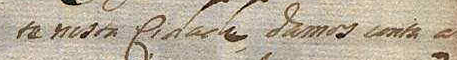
te nesta Cidade, damos conta a
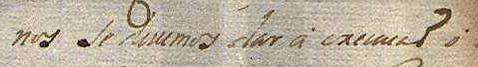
nos se deuemos dar a execuçaõ o
